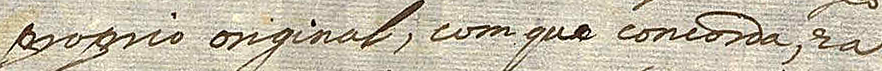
proprio originaL, com que concorda, E a
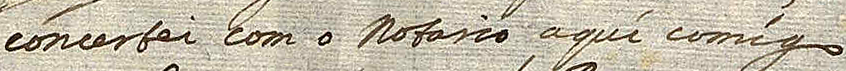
concertei com o Notario aqui comigo
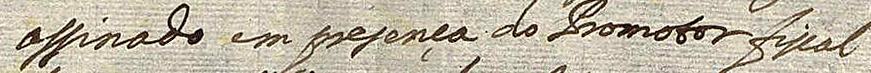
assinado em presença do Promotor fiscal
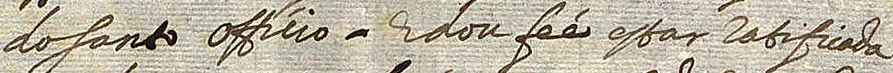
do santo officio - E dou feé estar Ratificada
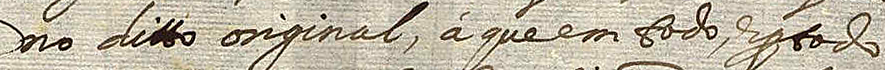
no ditto original, á que em todo, E ꝑ todo
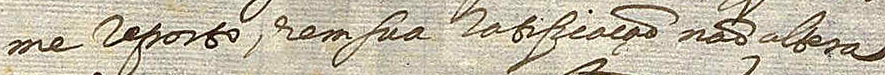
me Reporto, E em sua Ratificação naõ altera
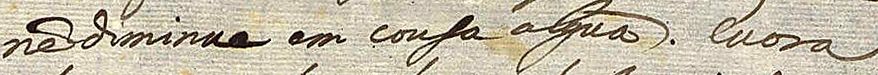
nē diminue em cousa algūa. Euora
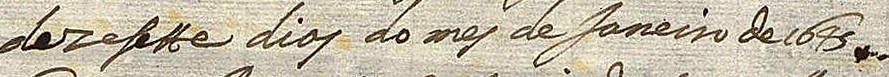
dezesette dias do mes de Janeiro de 1645.
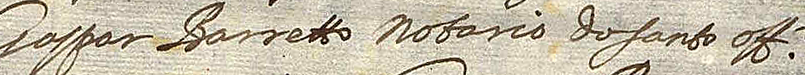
Gaspar Barretto notario do santo off.o
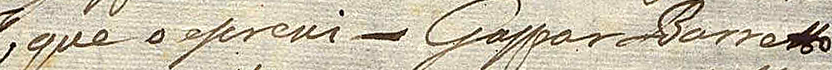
que o escreui - Gaspar Barreto
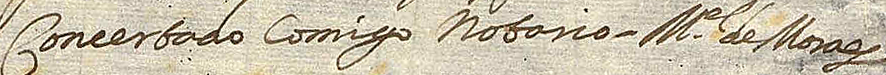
Concertado comigo notario - M.el de Moraes
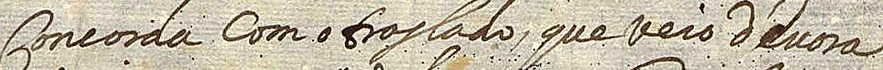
Concorda com o traslado, que veio d'euora
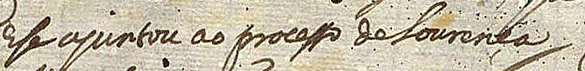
E se ajuntou ao processo de Lourença
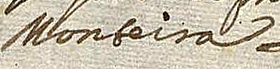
Monteira
